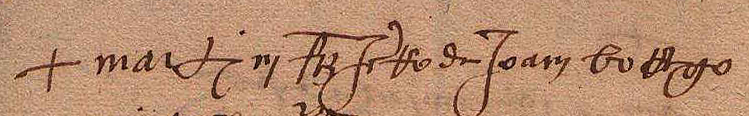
+ martjm fr̄z JēRo de Joam boRego
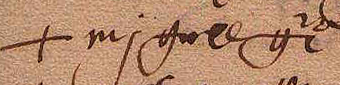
+ mjguel gria
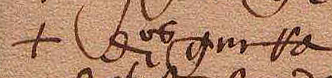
+ dos gueRa
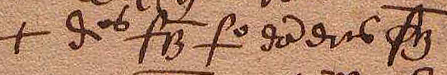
+ dos fr̄z fo dādres frz̄
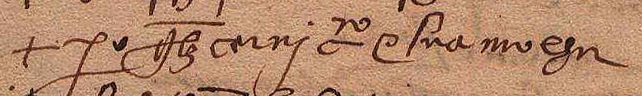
+ po ḡlz carnjcro e sua molher
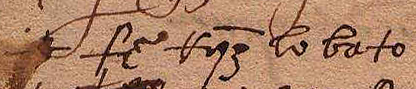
+ frco Roj̄z lobato
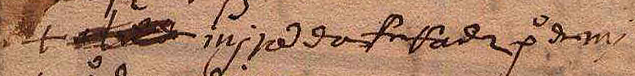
+ _ mjrāda feRador po de mj
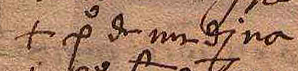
+ po de medjna
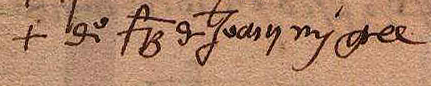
+ do fr̄z de Joam mjgell
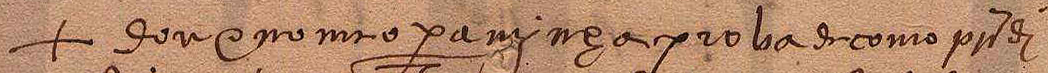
+ dou e nomeo ꝑa mjnha proba de como prēdj
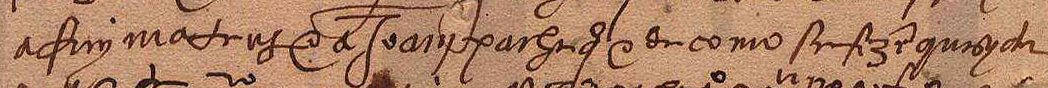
a frey mateus e a Joam pacheq̄o e de como se fez ēquesydor
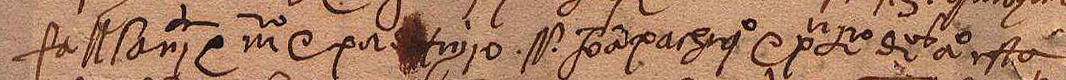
fallsamte e mro e por _teyro .ss. Joā pacheqo e portro dos ao esta
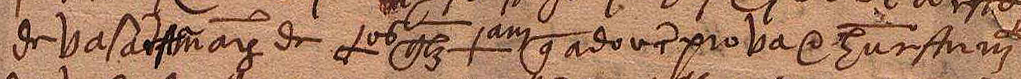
deVasa ē sta marḡda dos gl̄z tam q̄ a dou ē prova e hū estormto
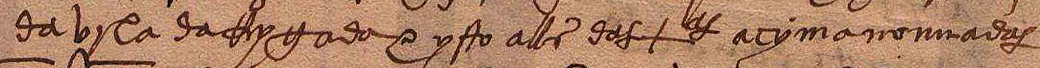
da vjla da Reygada e ysto allē das tas acyma nomeadas
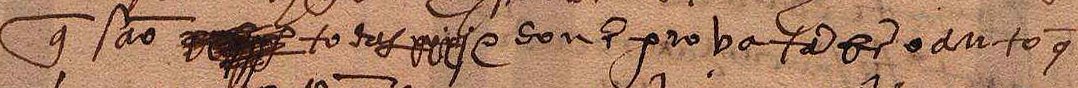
q̄ são _ todas xxxj e dou ē prova tābē o auto q̄
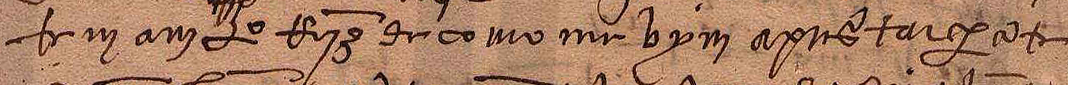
tem amto Roj̄z de como me vym apres̄tar ꝑāte
